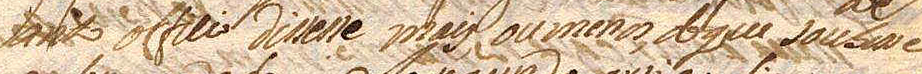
anto officio dissesse mais ou menos, do que soubesse
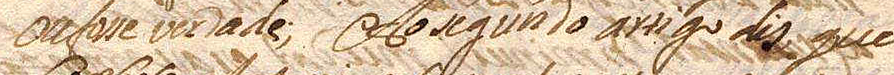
ou fosse verdade; Ao segundo artigo dis, que
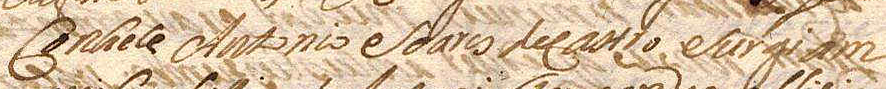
Conhece Antonio Soares de Castro Surgiam
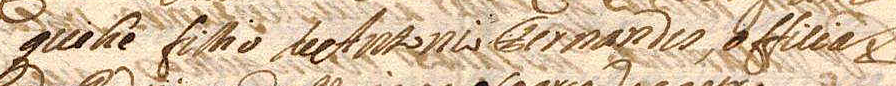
que he filho de Antonio Fernandes, officiaL
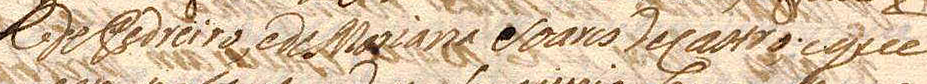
de Pedreiro, e de Mariana Soares de Castro; e que
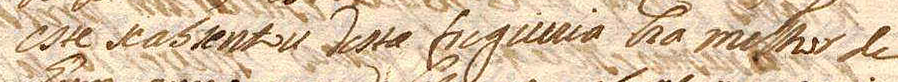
este se absentou desta freguezia ha melhor de
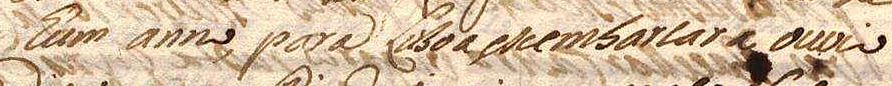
hum anno, para Lisboa, e se embarcara ouvio
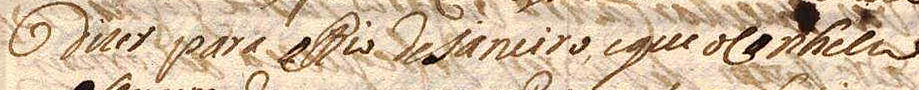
dizer para o Rio de Ianeiro, e que o conhecia
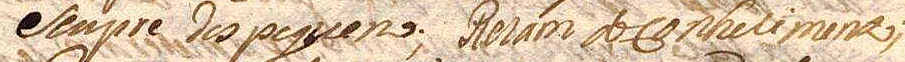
sempre des pequeno; Rezam do conhecimento;
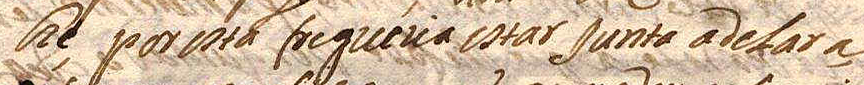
he, por esta freguezia estar junta a delara,
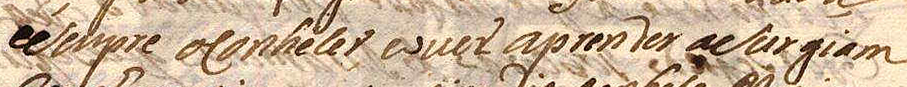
e sempre o Conhecer, e o uer aprender a surgiam
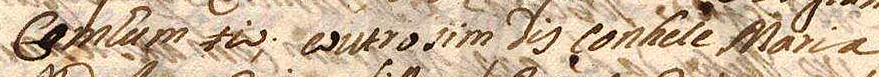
Com hum tio; e outrosim dis conhece Maria
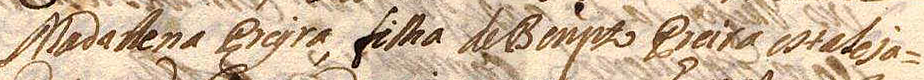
Madallena Preyra, filha de Benpto Preira estaleja
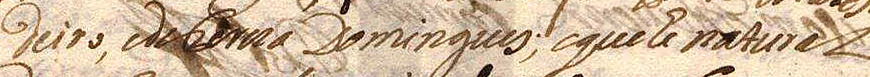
deiro, e de Tereza Domingues; e que he natural
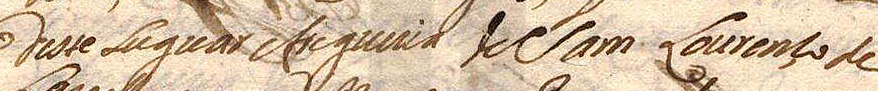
deste Luguar freguezia de Sam Lourenço de
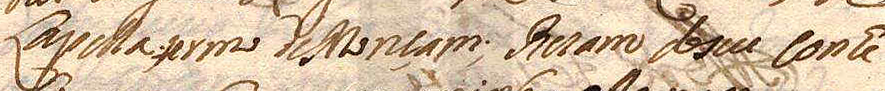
Lapella termo de Monçam; Rezam do seu conhe
